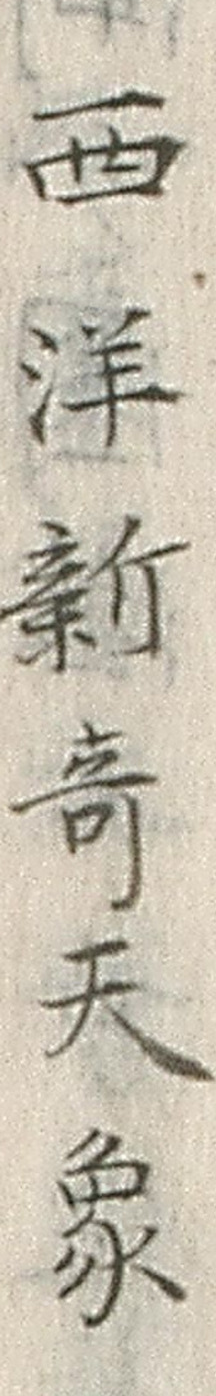西洋新奇天象
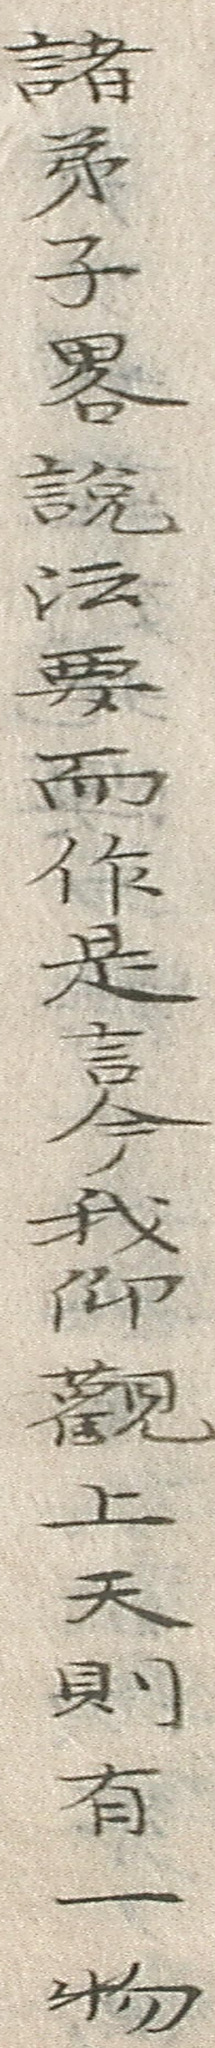諸弟子略説云〻要而作是言今我仰観上天則有一物
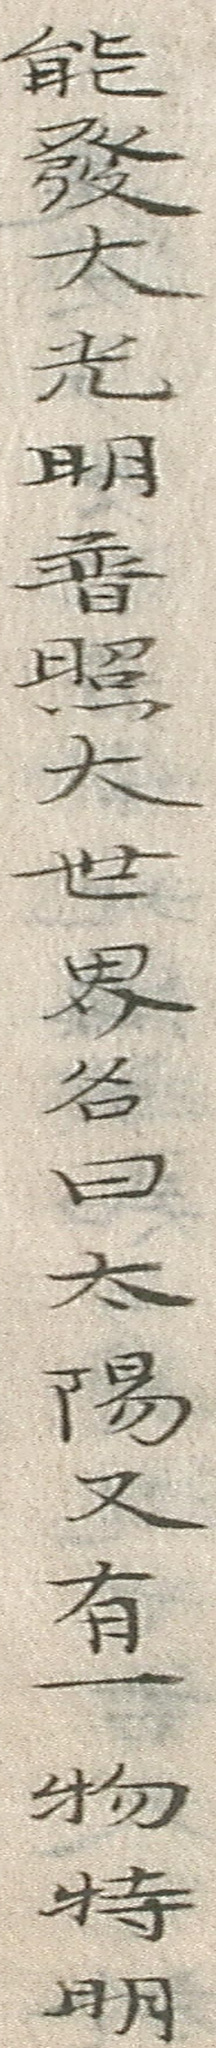能発大光明普照大世界名曰太陽又有一物特明
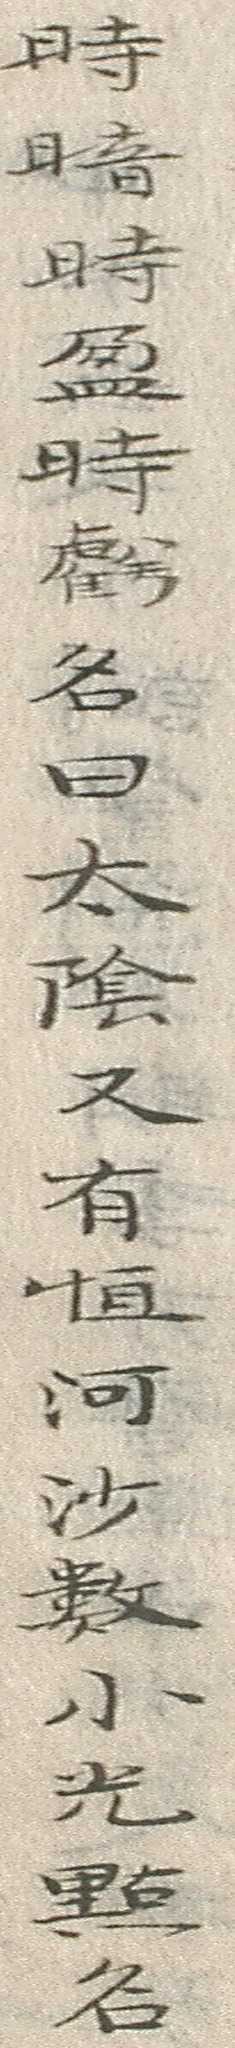時暗時盈時𧇾名曰太陰又有恒河沙数小光点名
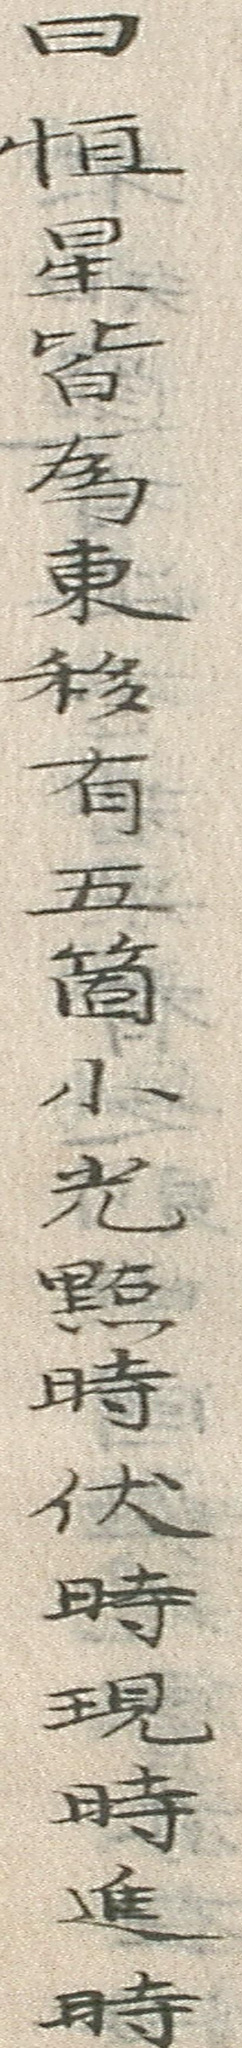曰恒星皆為東移有五箇小光点時伏時現時進時
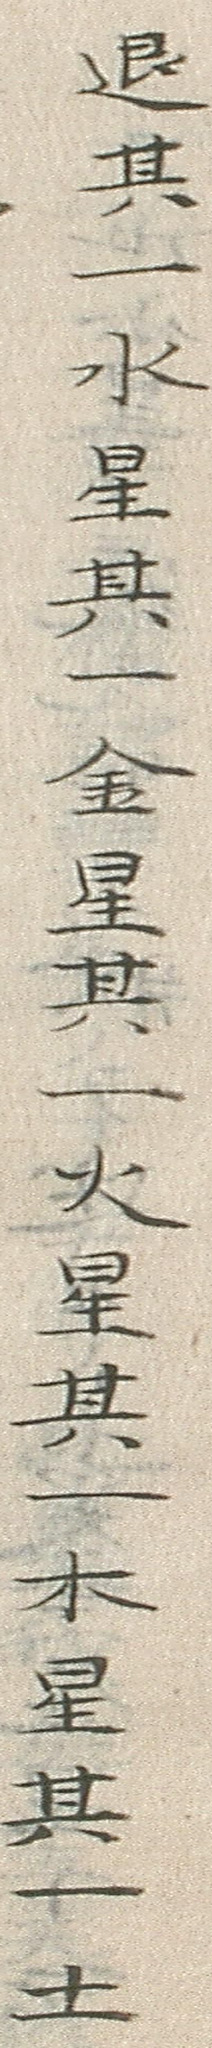退其一水星其一金星其一火星其一木星其一土
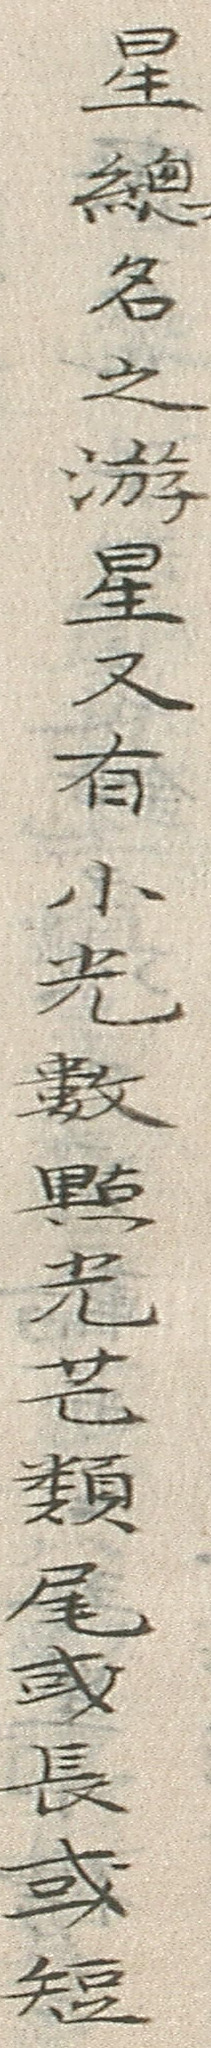星総名之游星又有小光数点光芒類尾或長或短
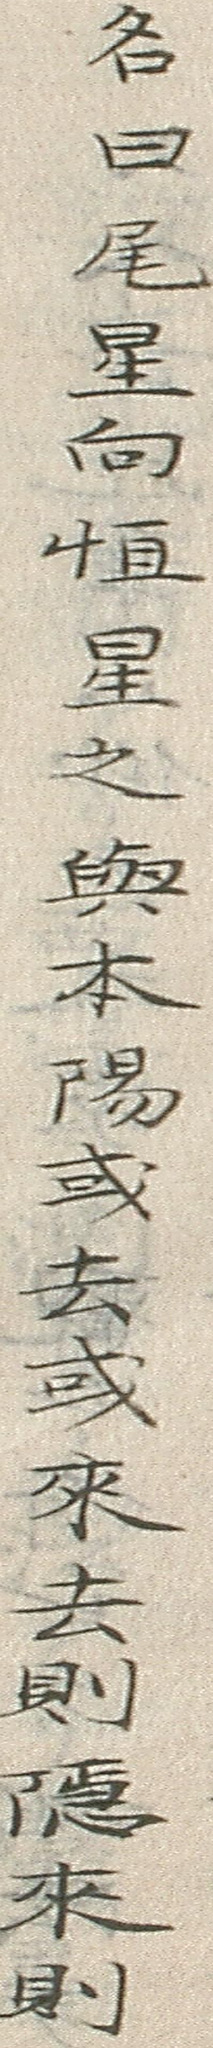名曰尾星向恒星之与本陽或去或来去則隠来則
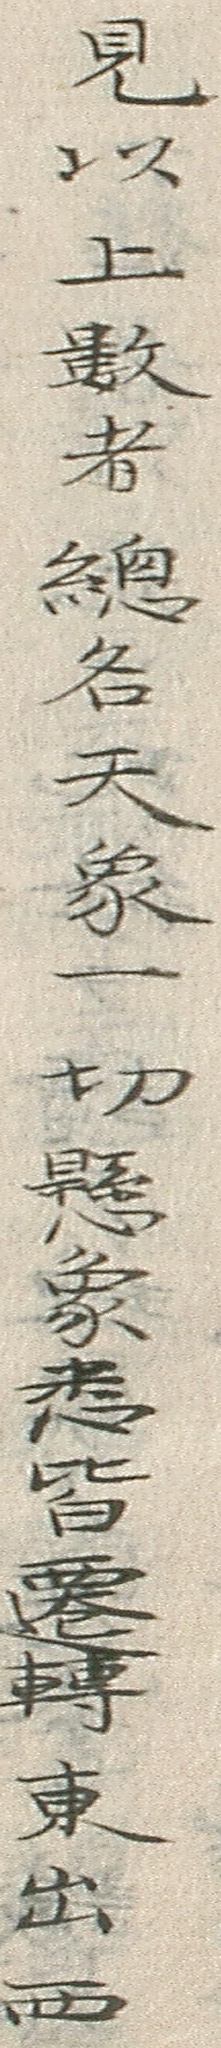見以上数者総名天象一切懸象悉皆遷転東出西
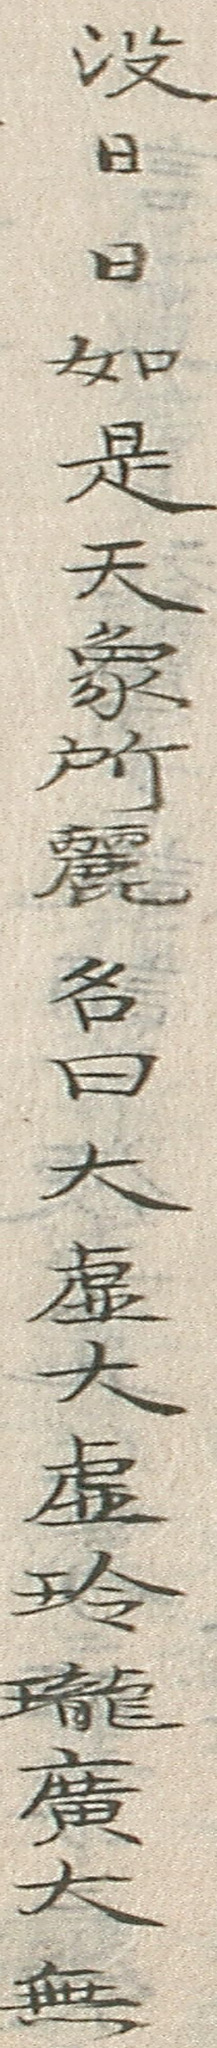没日日如是天象所麗名曰大虚大虚玲瓏広大無
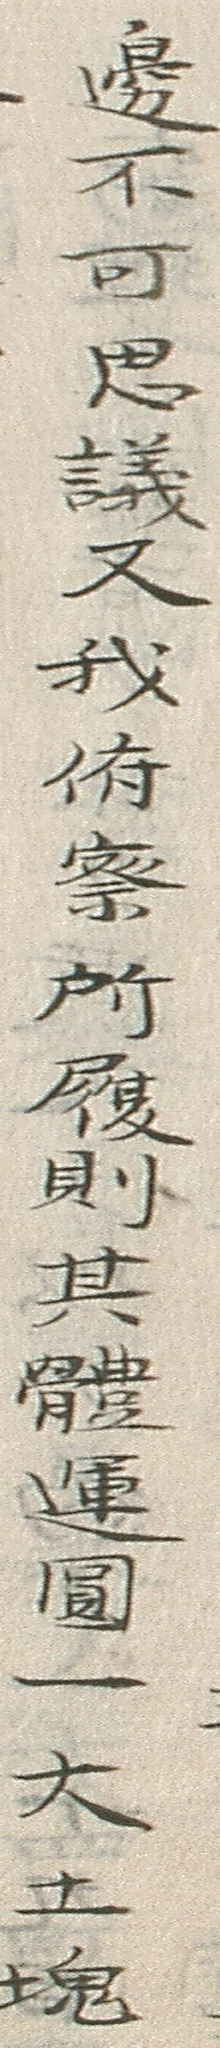辺不可思議又我府察所履則其体運円一大土塊
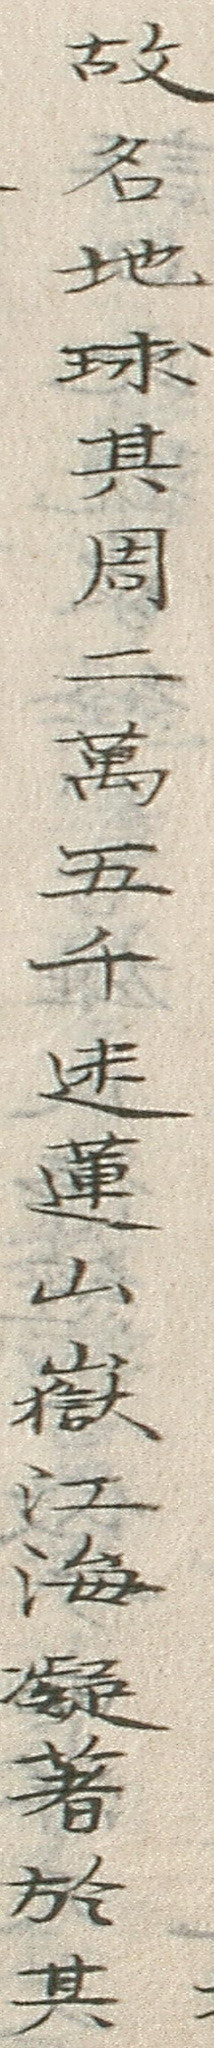故名地球其周二万五千迷蓮山嶽江海凝著於其
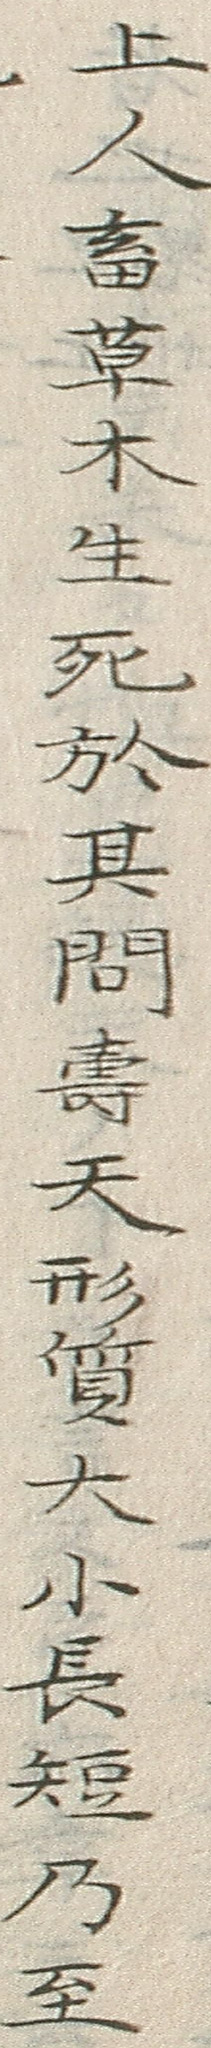上人畜草木生死於其問寿天形質大小長短乃至
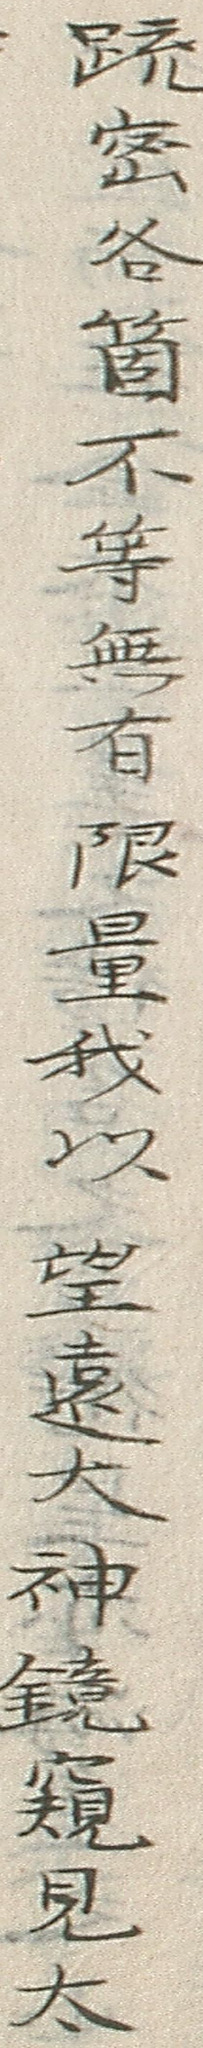䟽密各箇不等無有限量我以望遠大神鏡窺見太
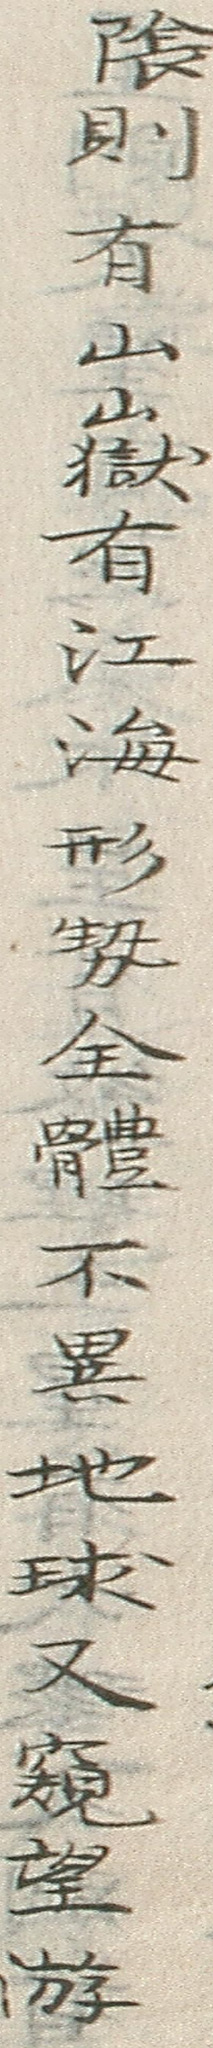陰則有山嶽有江海形勢全体不異地球人窺望游

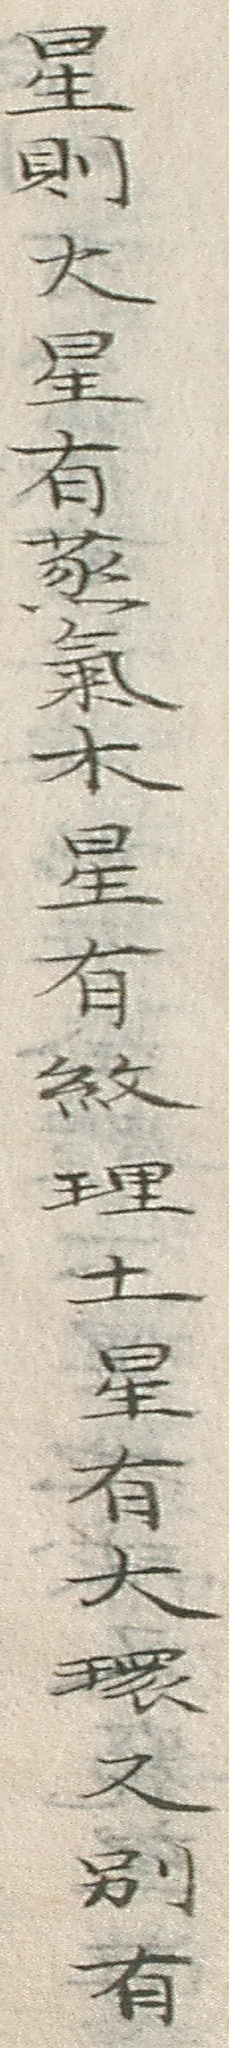星則火星有蒸気木星有紋理土星有大環又別有
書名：天學略名目羽翼　全
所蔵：東京大学地震研究所図書室 Earthquake Research Institute Library, The University of Tokyo, JAPAN
